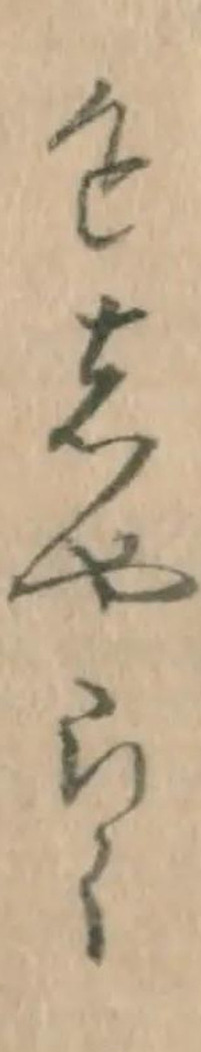をしやらく

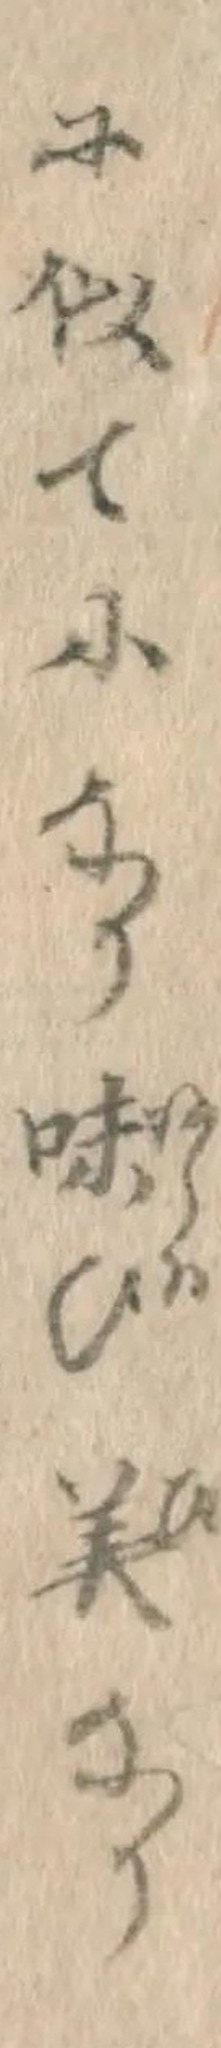に似て小なり味ひ美なり

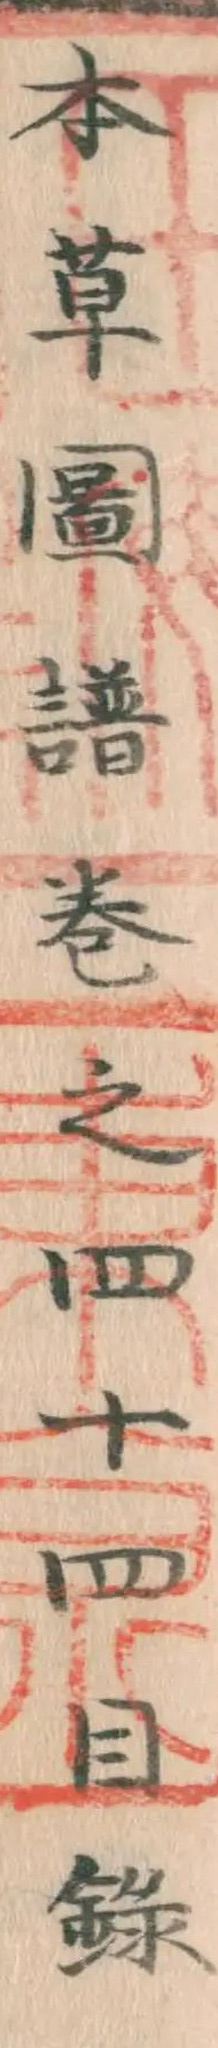本草図譜巻之四十四目録
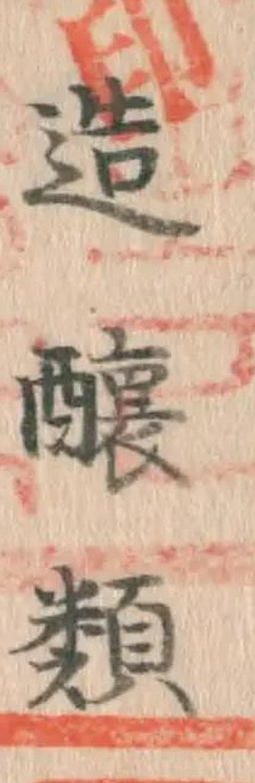造醸類

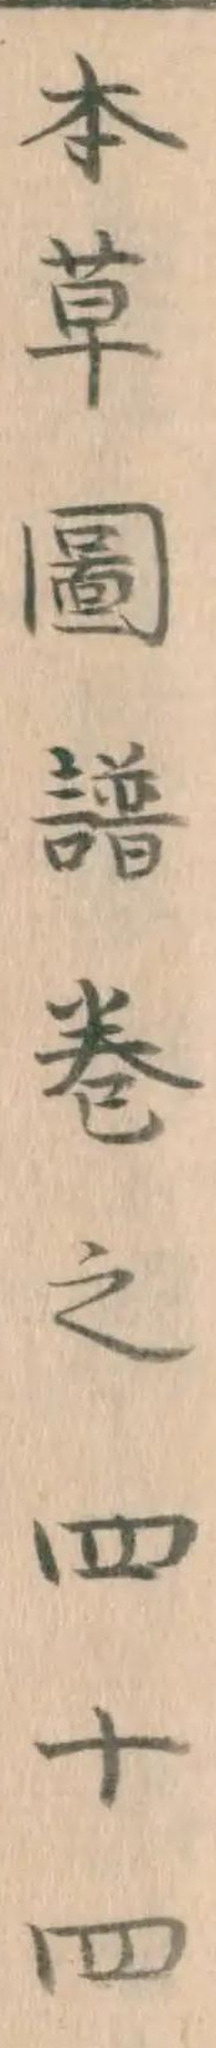本草図譜巻之四十四
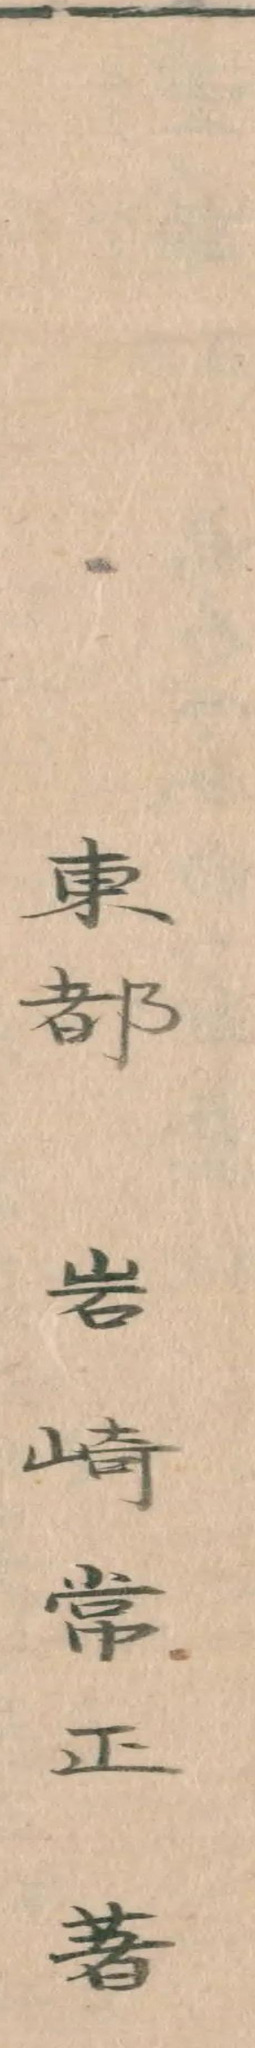東都岩崎常正著
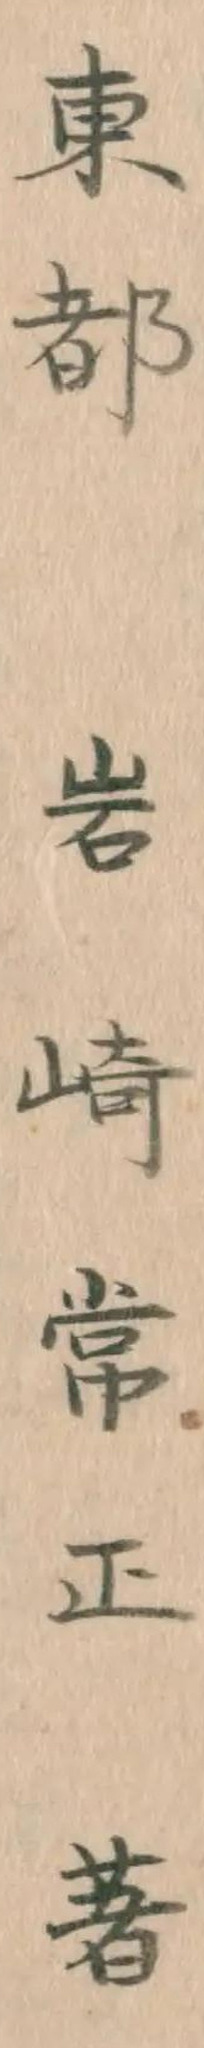東都岩崎常正著
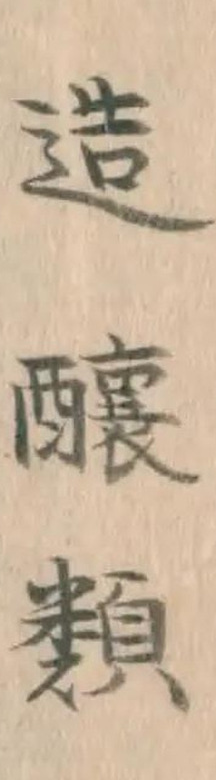造醸類
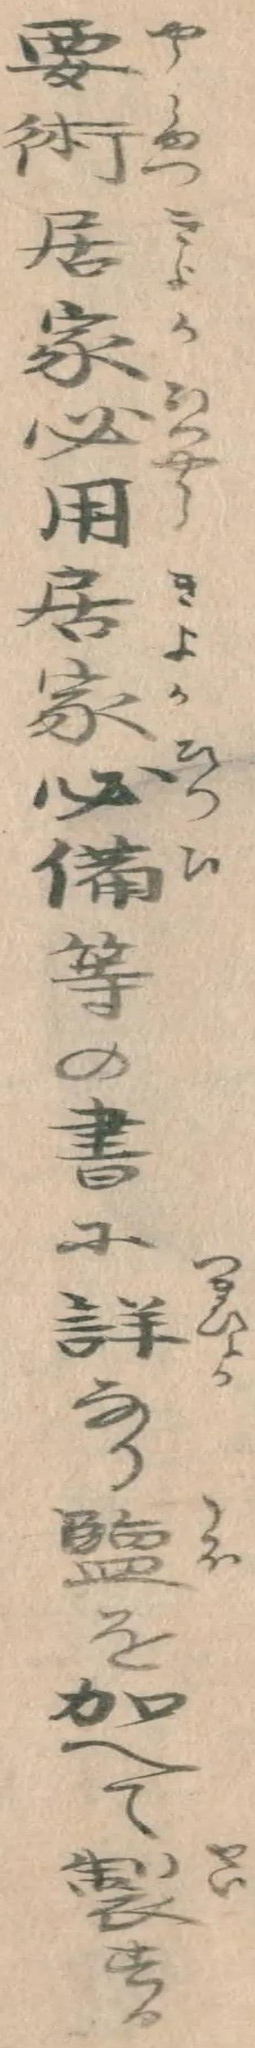要術居家必用居家必備等の書に詳なり塩を加へて製する
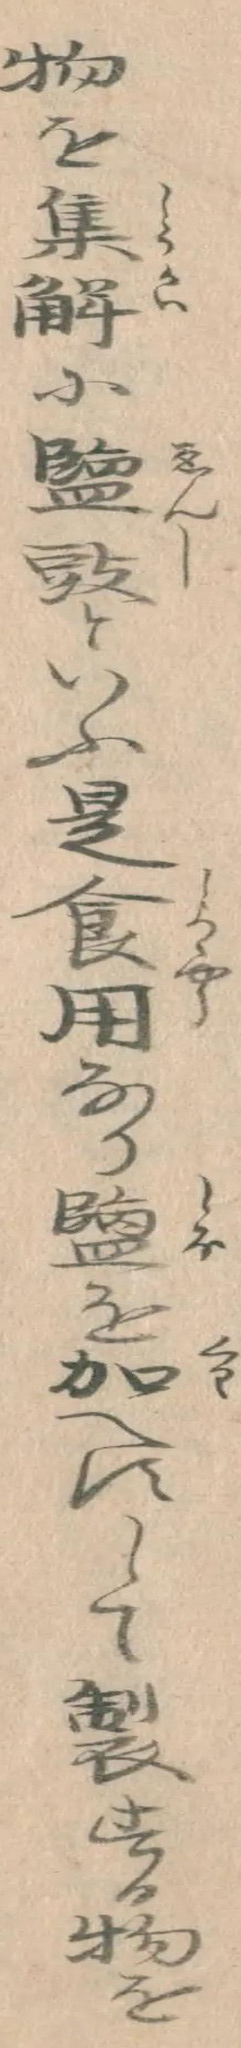物を集解に塩豉といふ是食用なり塩を加へすして製する物を
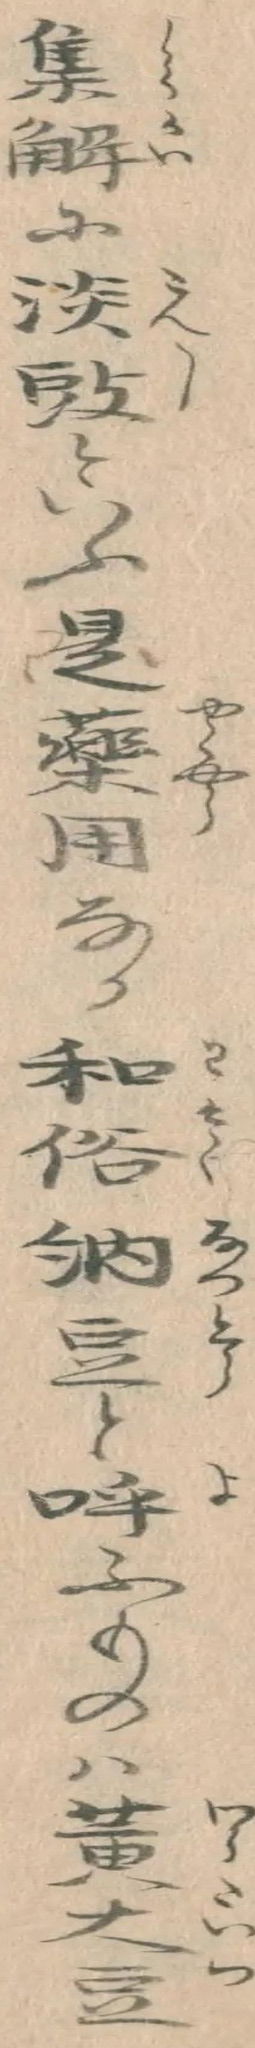集解に淡豉といふ是薬用なり和俗納豆と呼ふものは黄大豆

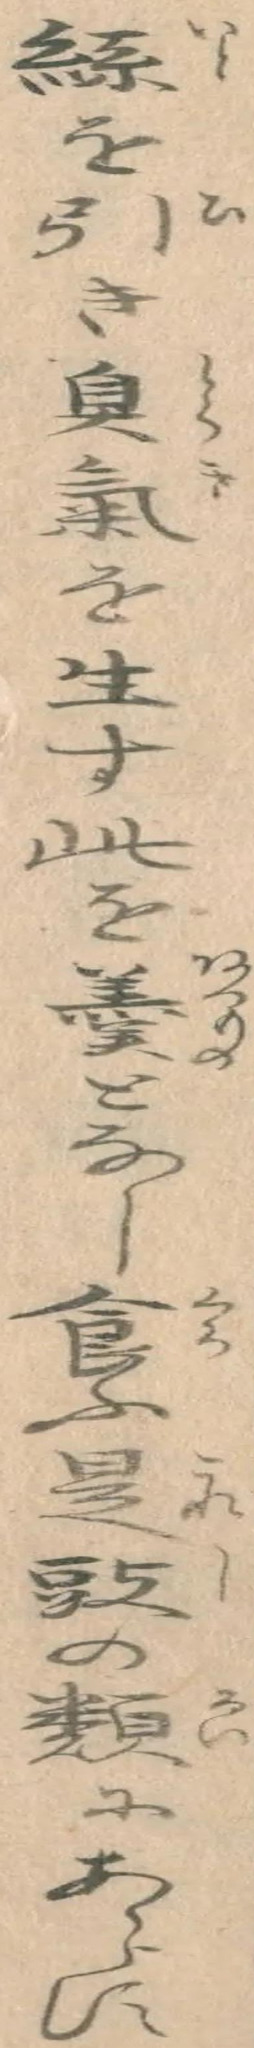糸を引き臭気を生す此を羹となし食ふ是豉の類にあらす
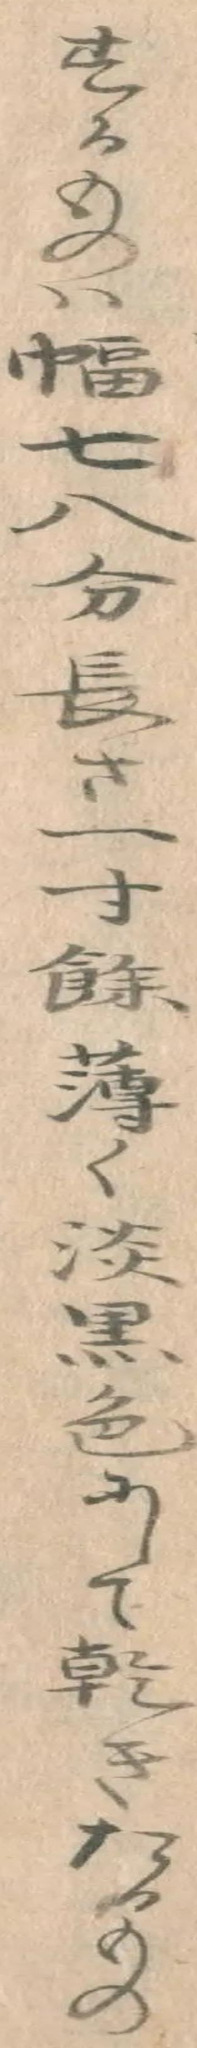するものは幅七八分長さ一寸余薄く淡黒色にして乾きたるもの
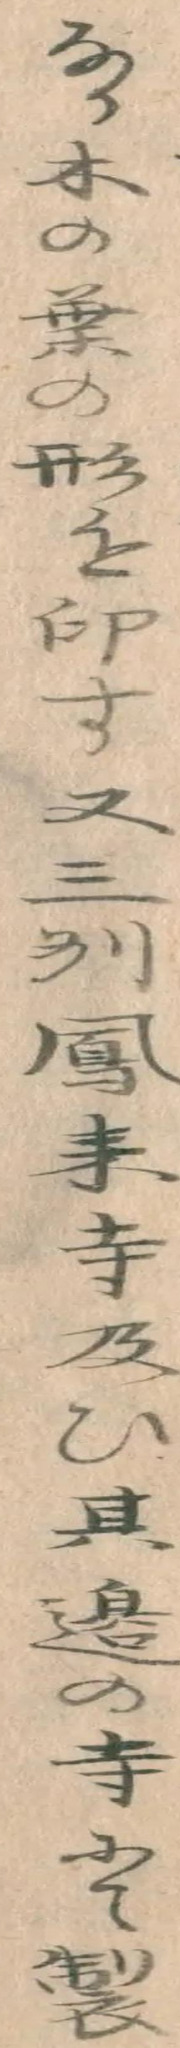なり木の葉の形を印す又三列鳳来寺及ひ其辺の寺にて製
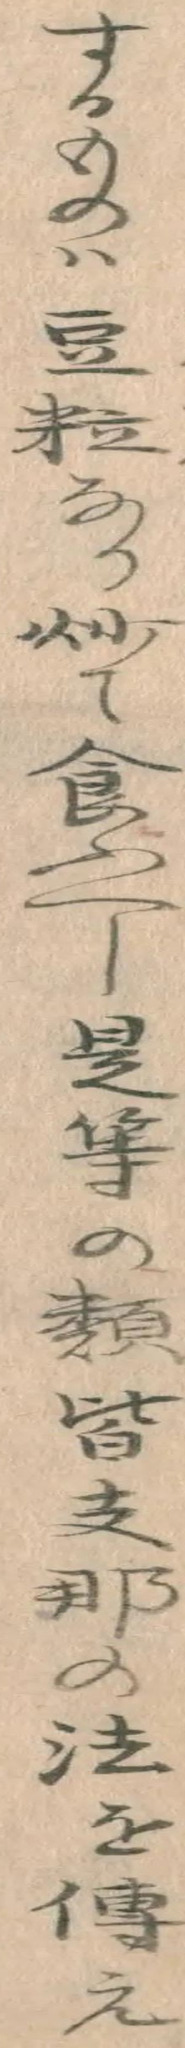するものは豆粒なり炒て食ふへし是等の類皆支那の法を伝え
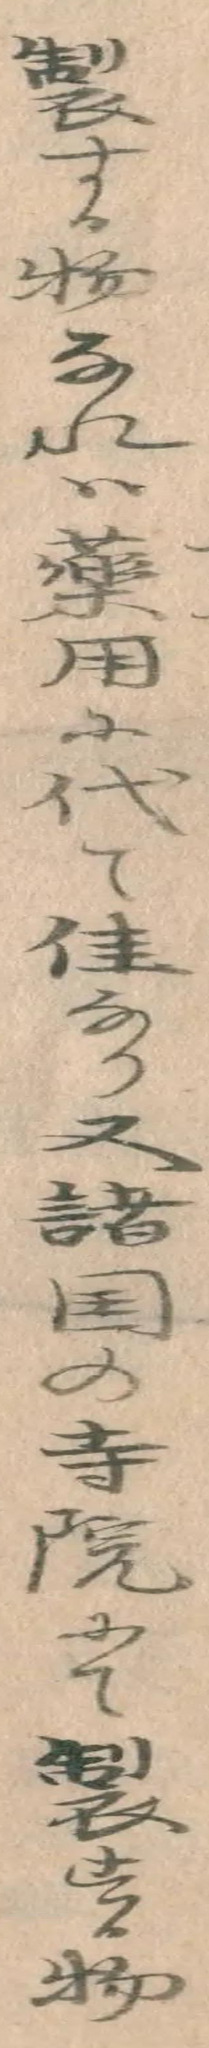製する物なれは薬用に代て佳なり又諸国の寺院にて製する物
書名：本草図譜. 巻43-45
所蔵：国立国会図書館 National Diet Library, JAPAN
